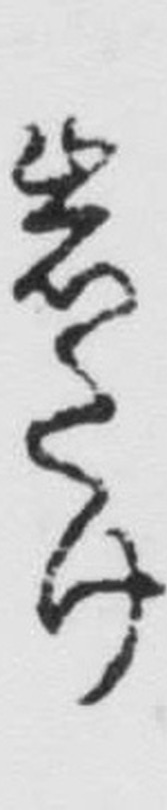岩たけ
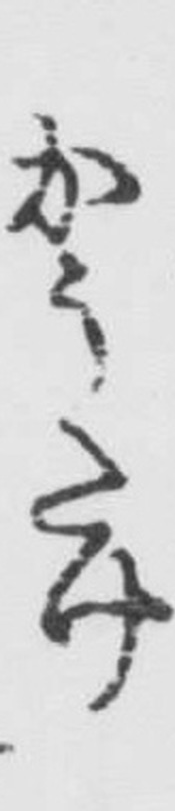かうたけ
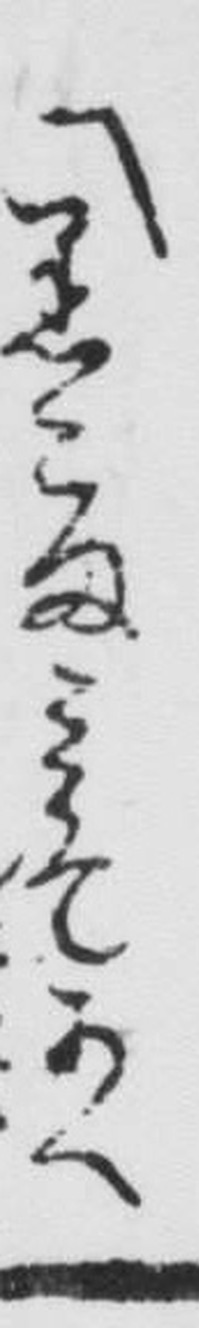〽黒こまみそあへ
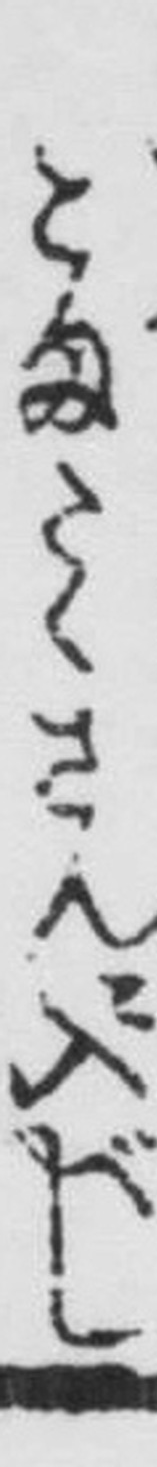こまたくさんに入べし
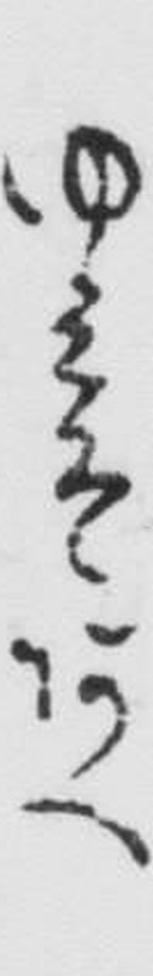ゆみそあへ
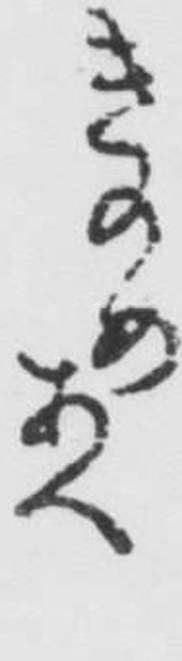きのめあへ
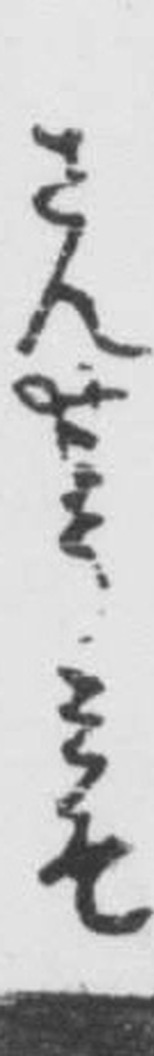さんせうみそ
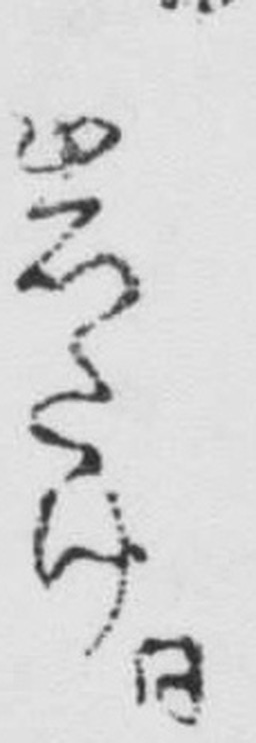岩たけ
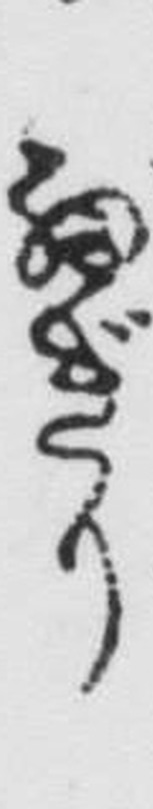細ぎり
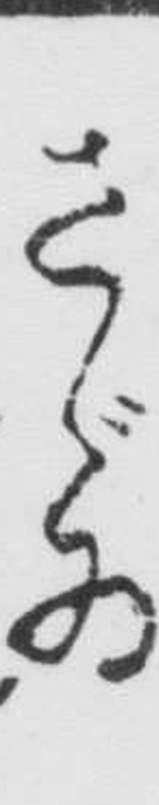さゞゐ
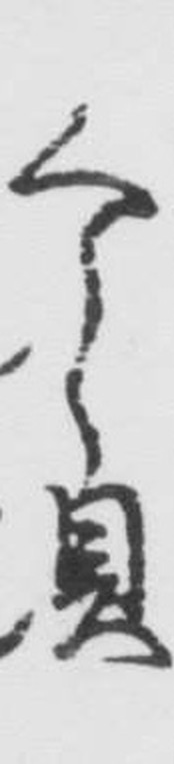くし貝
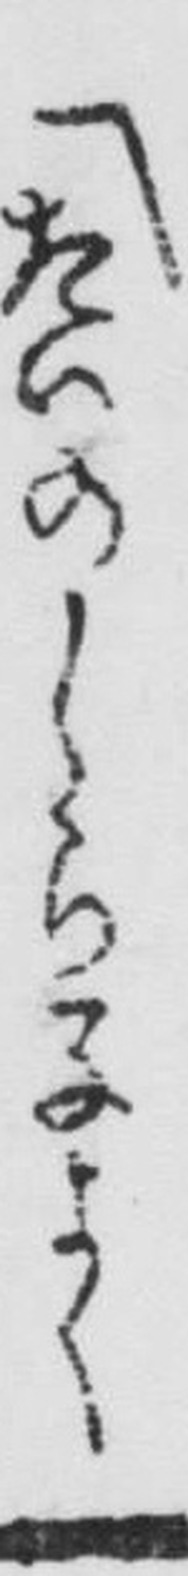〽たいのしら子よく
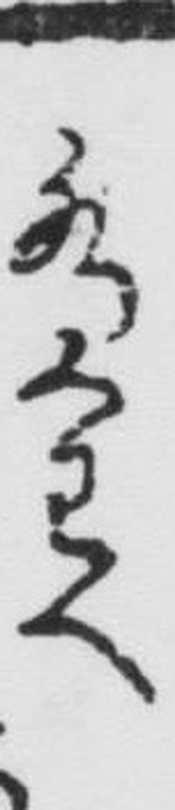水くわへ
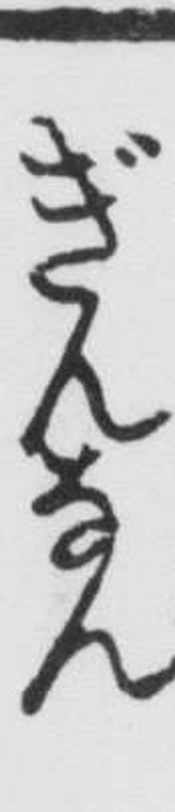ぎんなん
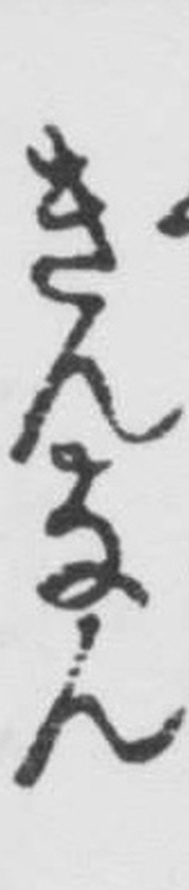きんなん
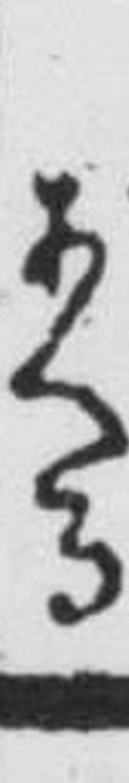あへる
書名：諸家通用/即席料理
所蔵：大阪府立大学学術情報センター 国文学研究資料館
